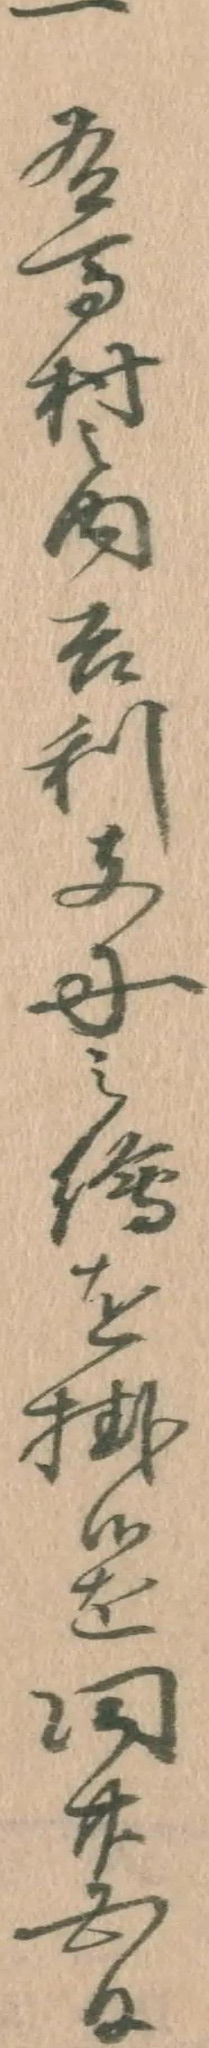一有馬村之内吉利支丹之絵を掛候を同廿五日
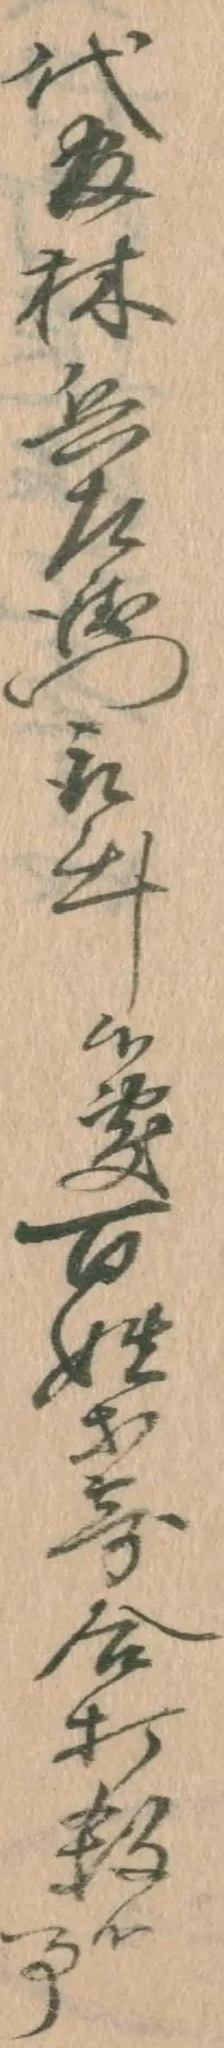代官林兵左衛門取出し候處百姓等寄合打殺候事
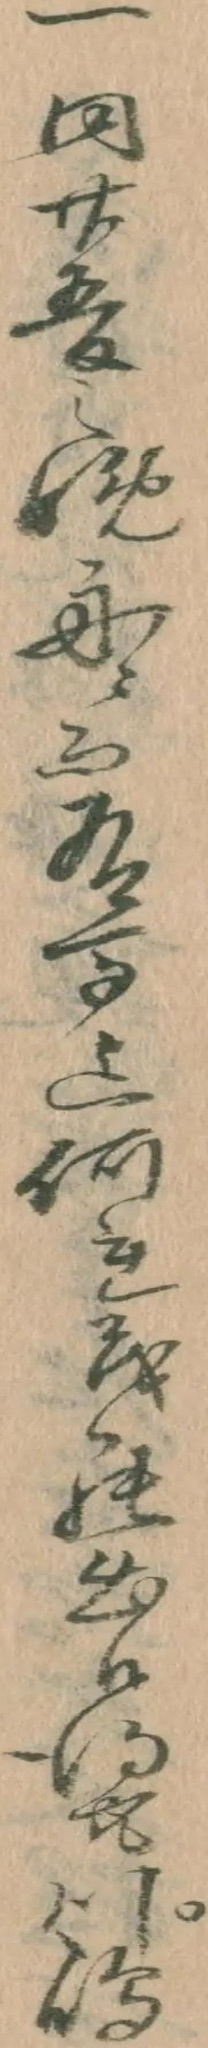一同廿五日之晩舟に而有馬迄何連茂罷出候共川島
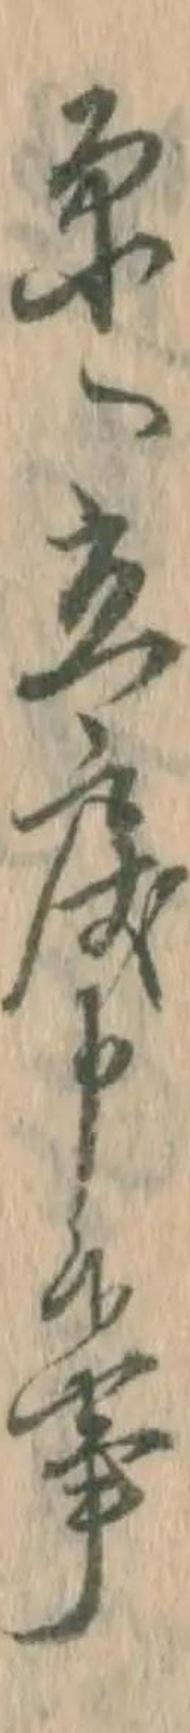原へ立戻申候事
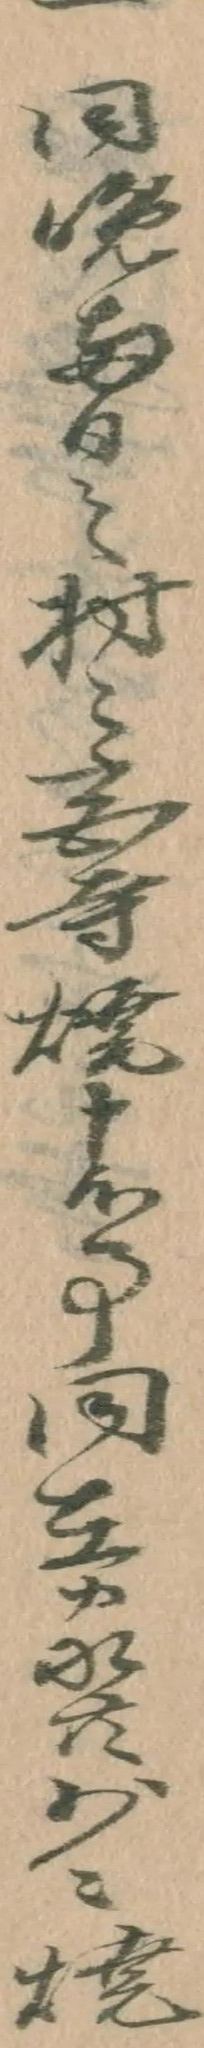一同晩両日之村々宮寺焼申候事同在家共少々焼
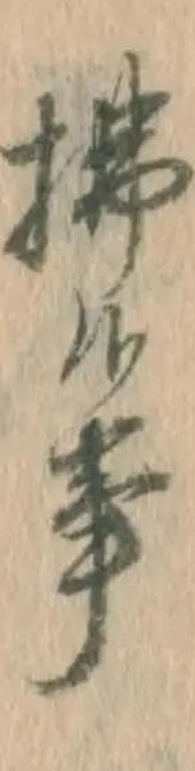払候事
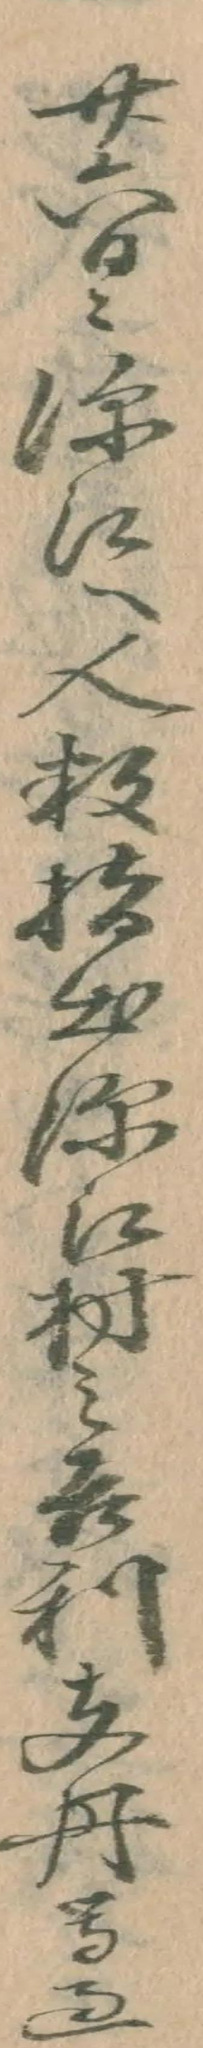一六日に深江へ人数指出深江村之吉利支丹等過
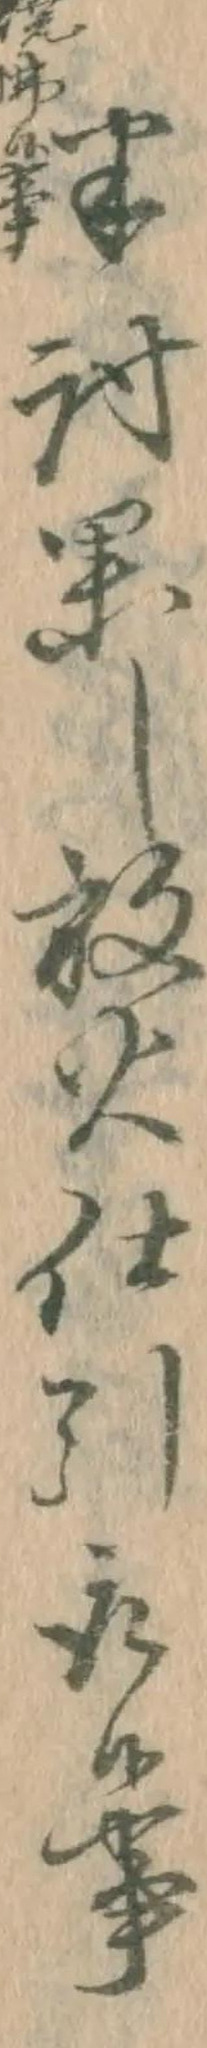半討果し放火仕引取候事
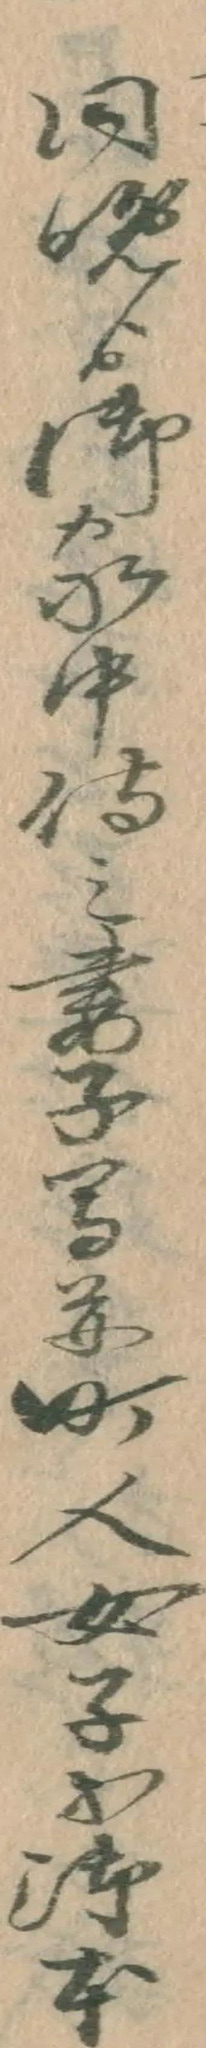一同晩ゟ御家中侍之妻子等幷町人女子等御本
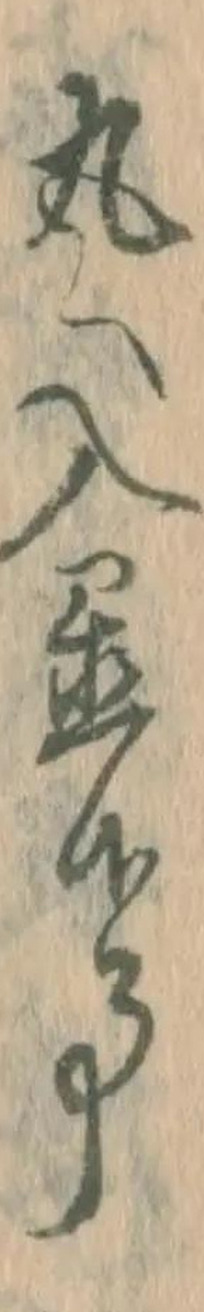丸へ入置候事
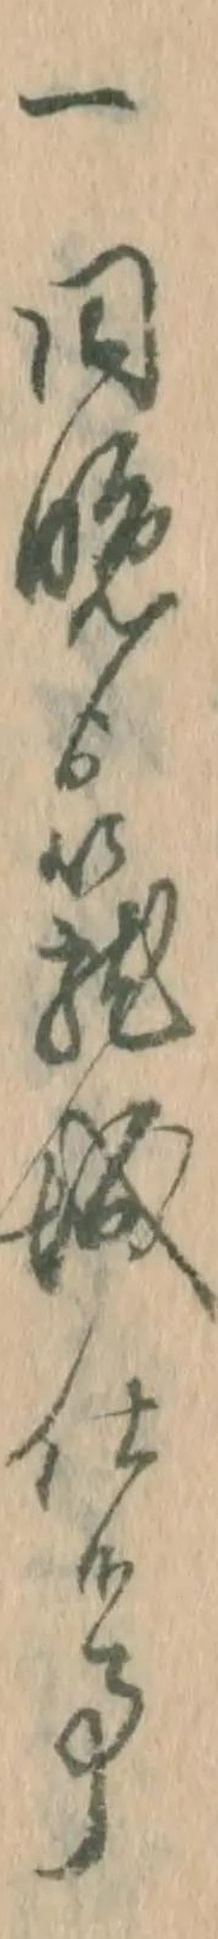一同晩ゟ籠城仕候事
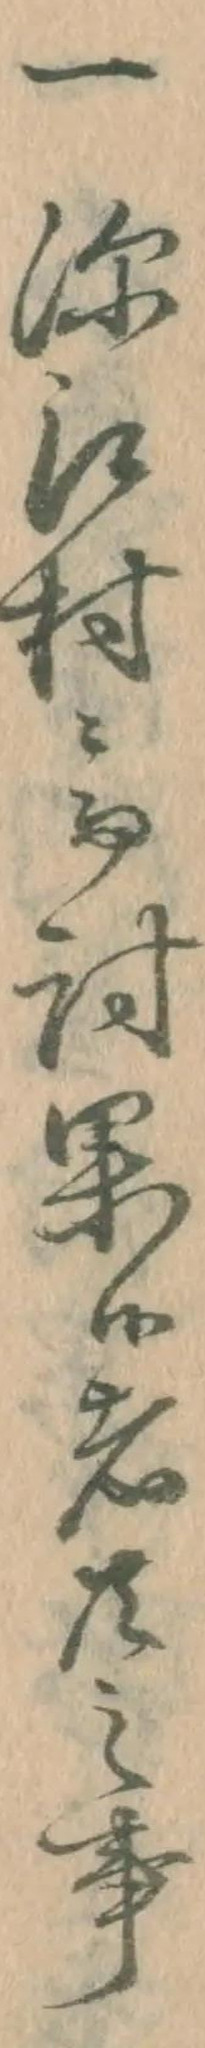一深江村に而討果候者共之事

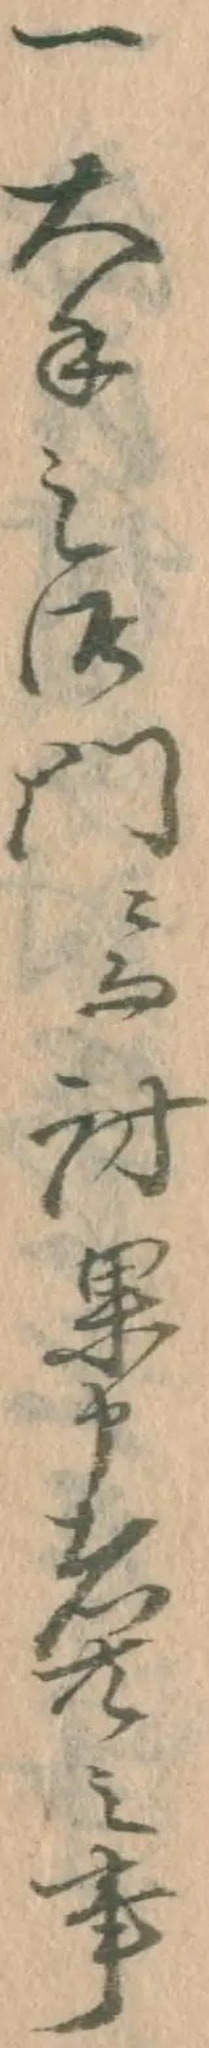一大手之御門に而討果申者共之事
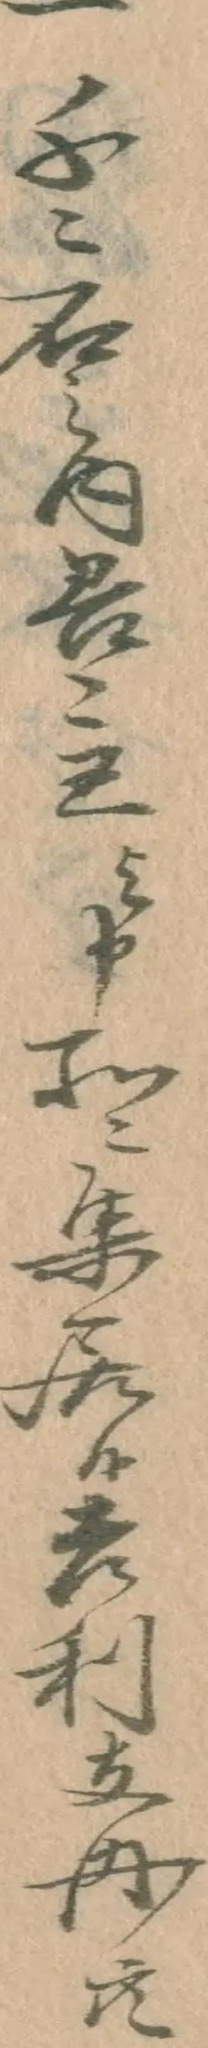一千々石之内善々已与申所に集居候吉利支丹共
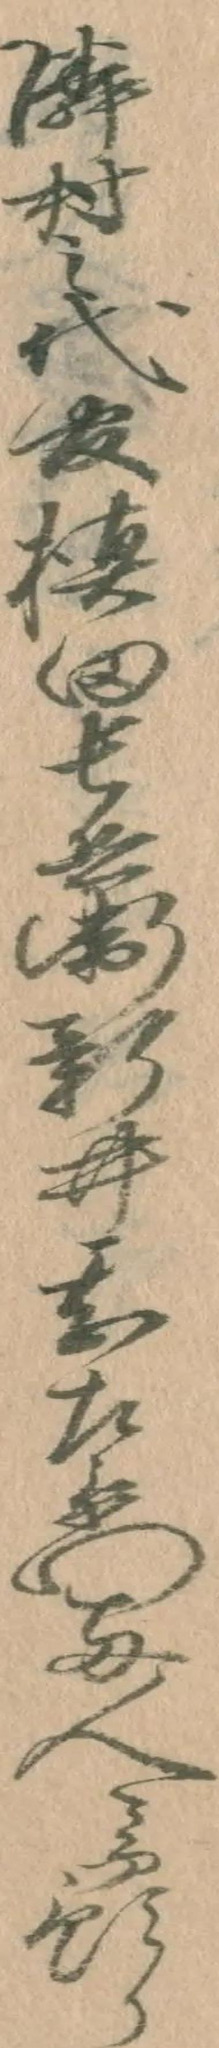隣村之代官槙田長兵衛新井甚左衛門両人に而預り
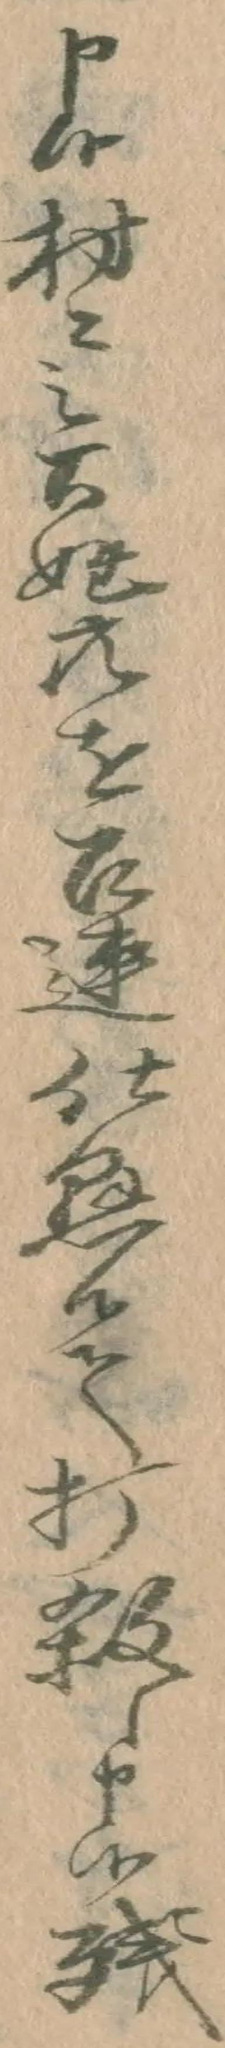申候村々之百姓共を召連仕懸候て打殺し申候残
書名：切支丹御退治記 49巻. [2]
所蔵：国立国会図書館 National Diet Library, JAPAN
